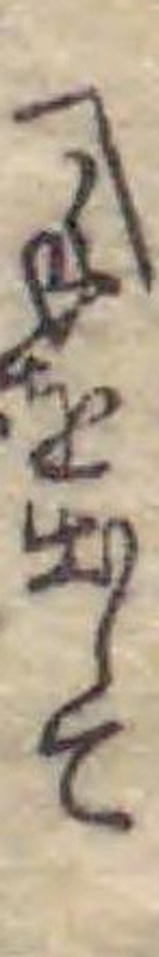〽手を出して
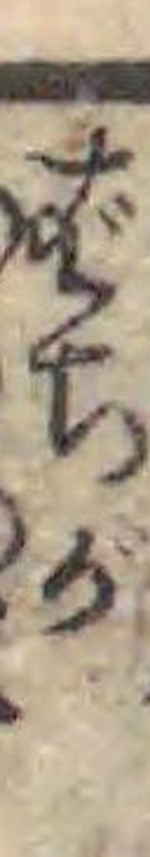ばちが
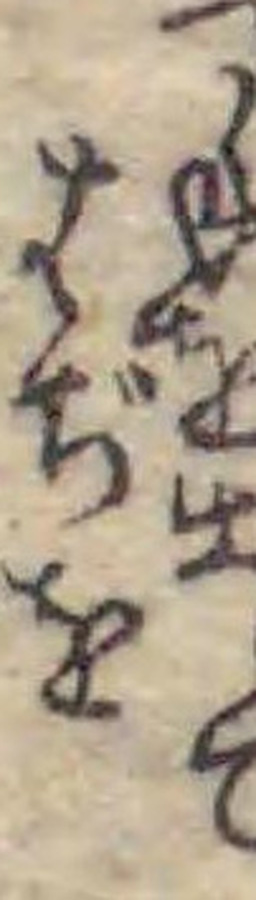はぢを
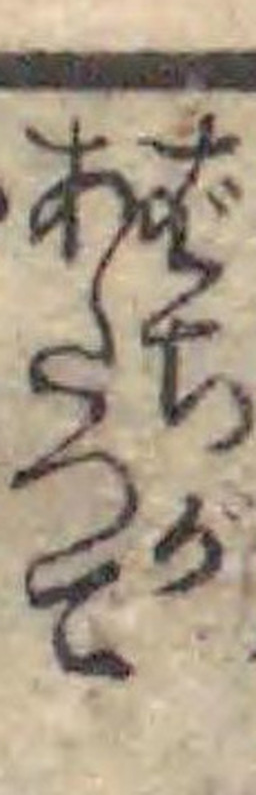あたつて
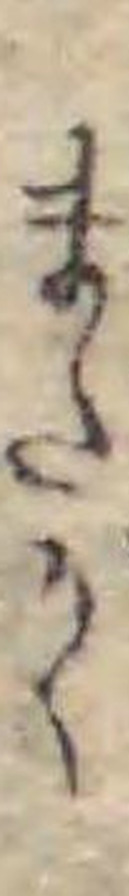またかく
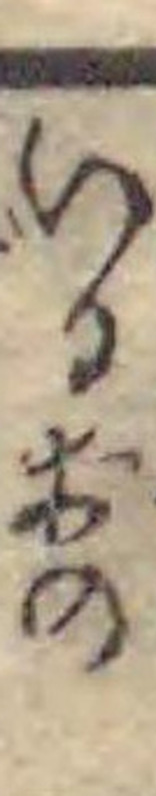いるおの
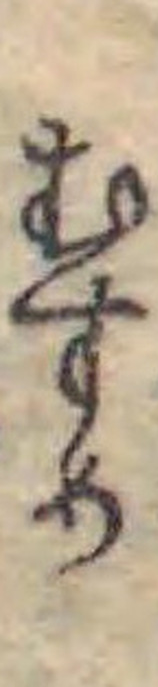むすめ
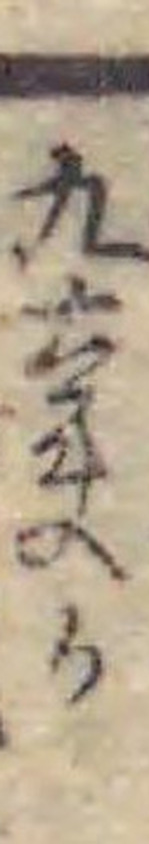九太夫か
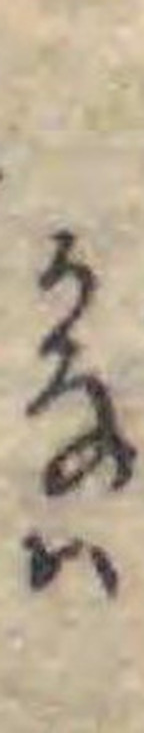かなは
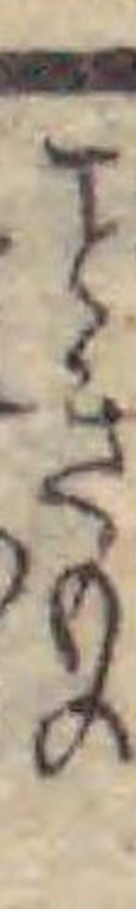こときもの
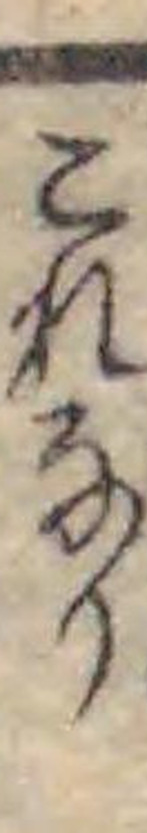これなり
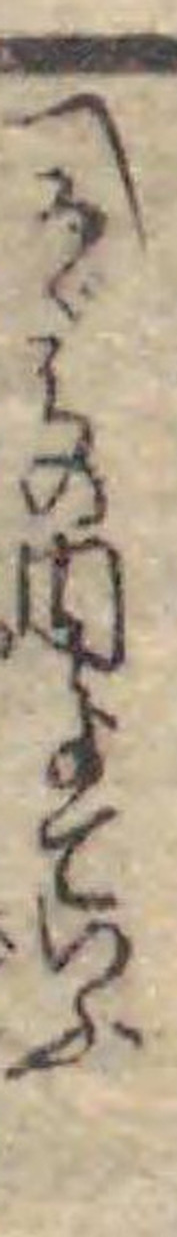〽かゞみの内にていふ
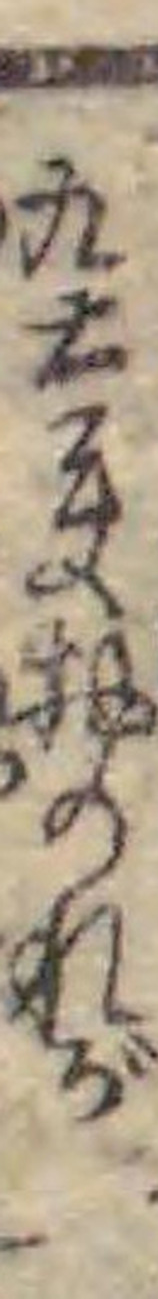九太夫おのれが
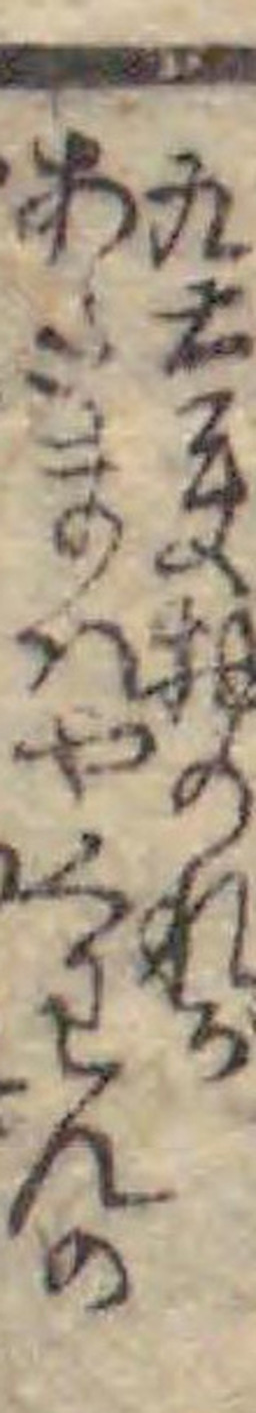あたまはやくわんの
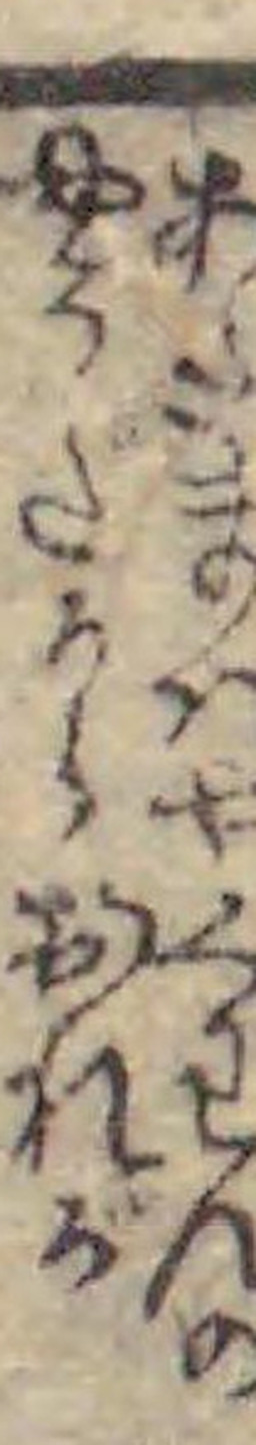やうだからおれが
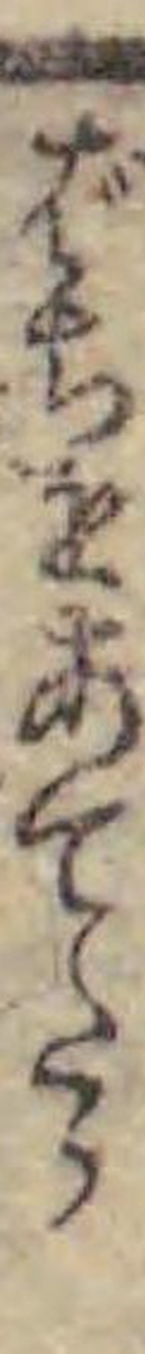ばちをあてたら
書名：人心鏡写絵 : 3巻
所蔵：国立国会図書館 National Diet Library, JAPAN
